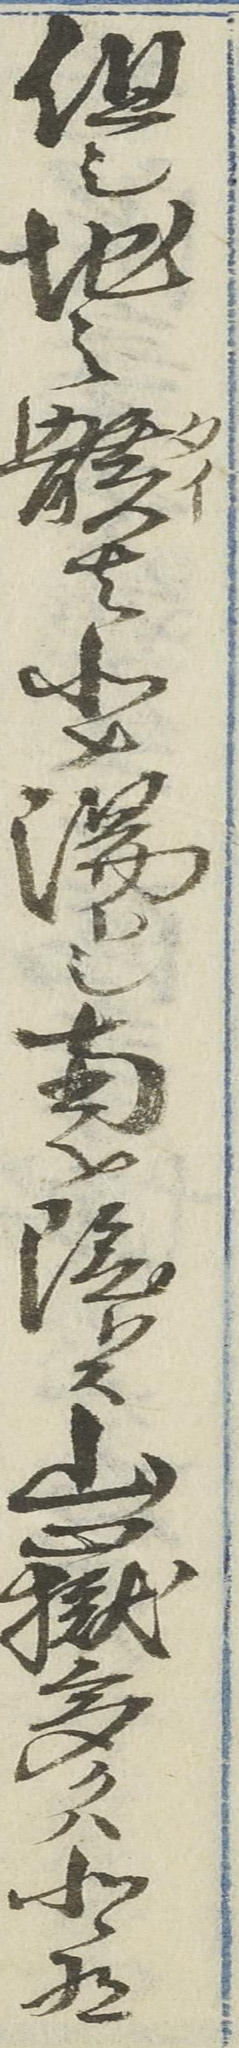但シ地之體タイハ北ヲ陽トシ南ヲ陰トス山嶽多クハ北二有
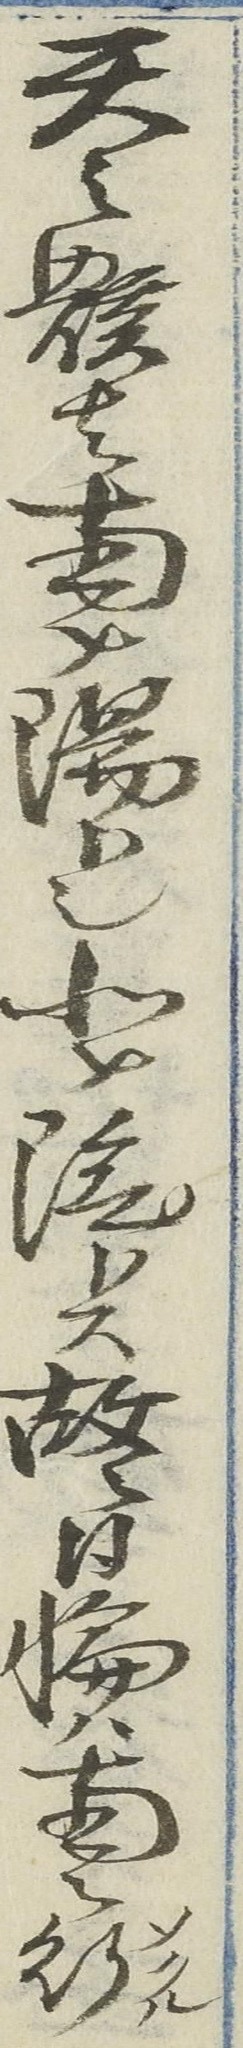天之體は南ヲ陽トシ北ヲ陰トス故ニ日輪ハ南ニ行メクル
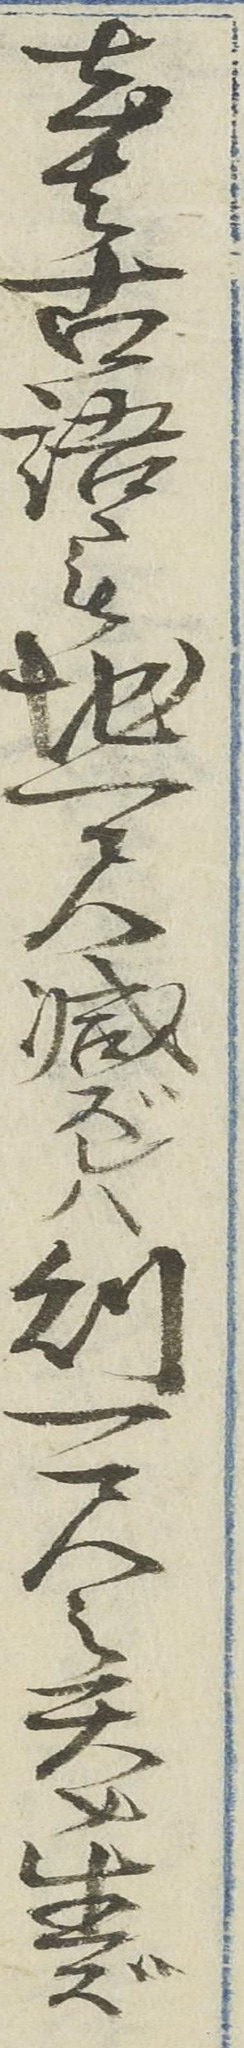至ハ古語ニモ地一尺減ズレハ則一尺之天ヲ生ズ
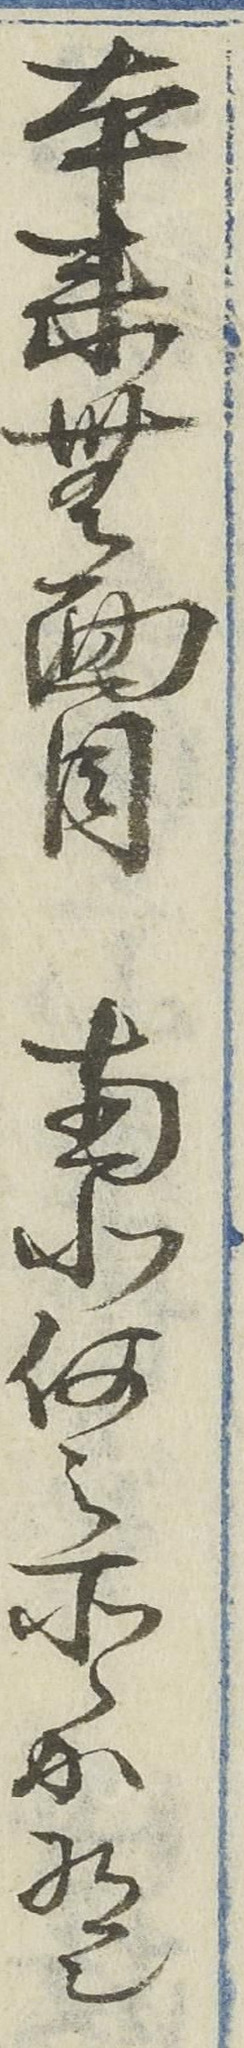本来無面目南北何之所二か有也
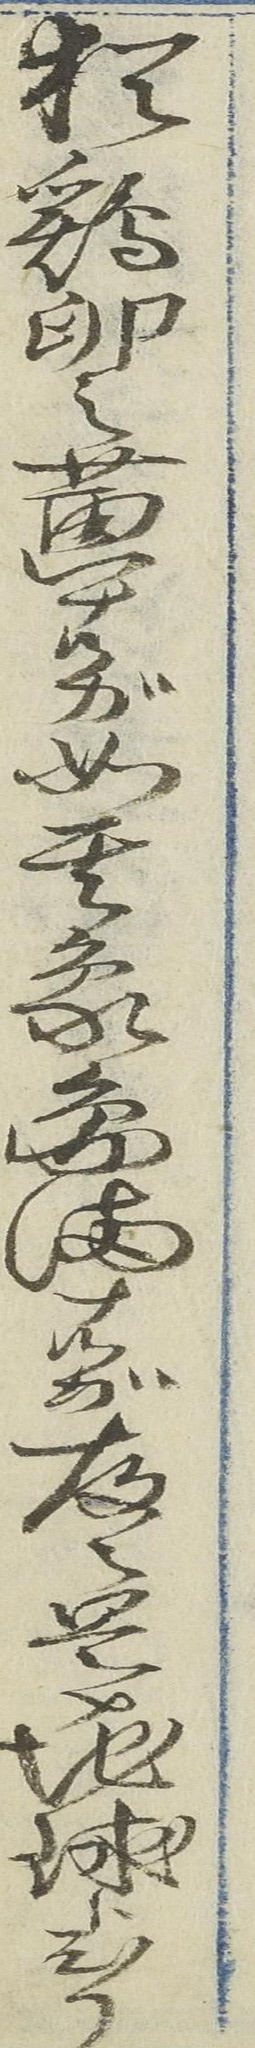猶鶏卵之黄ナルガ如其象円満ナルガ故ニ是ヲ地球ト云ウ

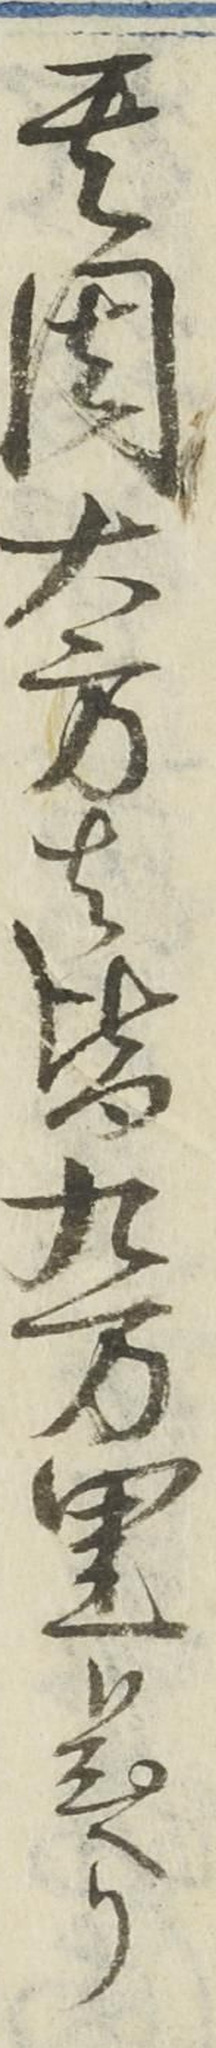其周大方ハ皆九万里ト云ヘリ
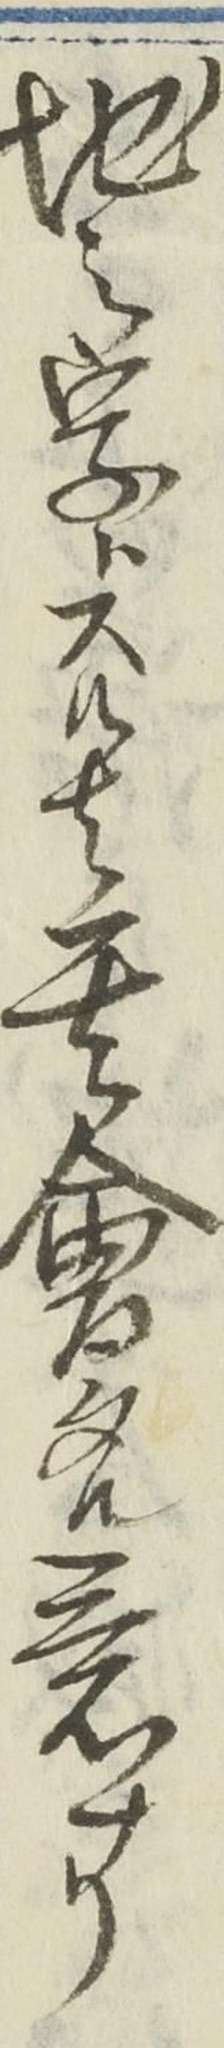地之字トスルハ其會タル意ナリ
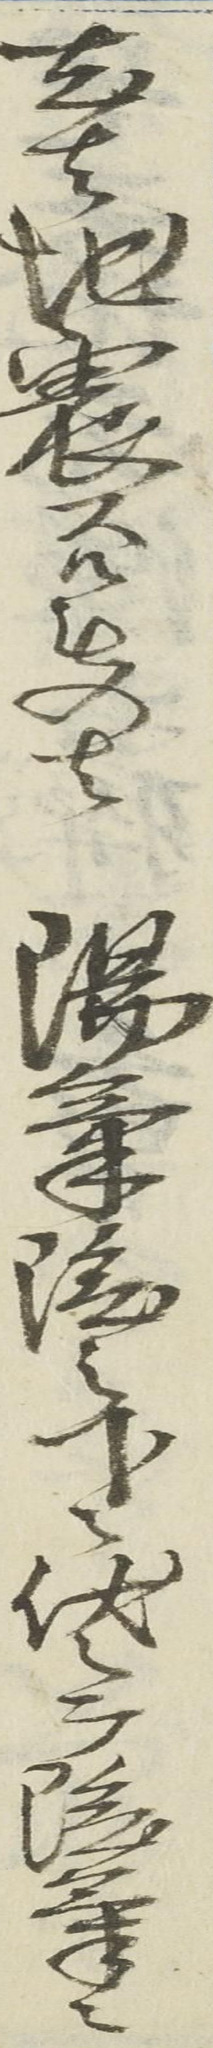去ハ地震スルモノハ陽気陰之下ニ伏しテ陰気ニ
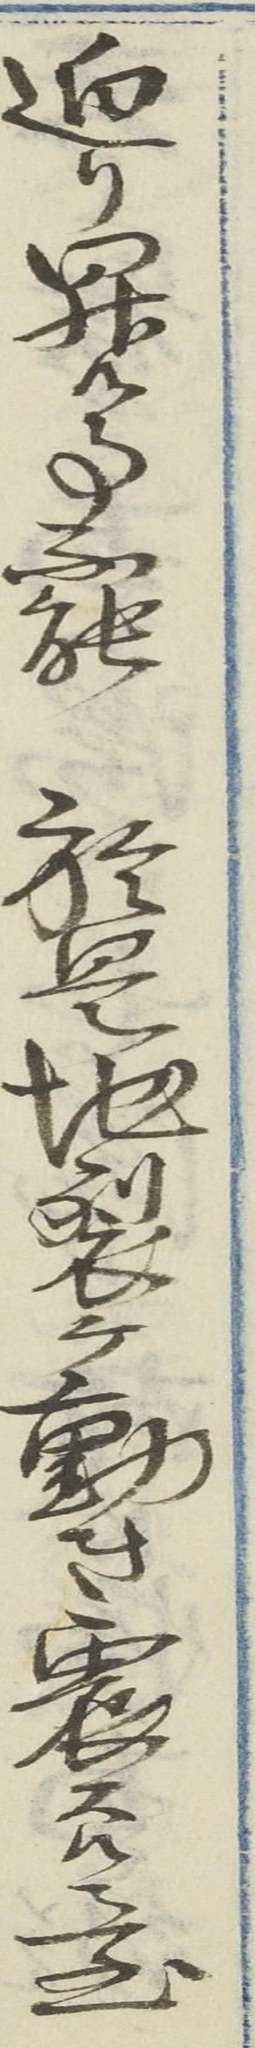迫リ昇ル事不能於是地裂テ動キ震スルニ至
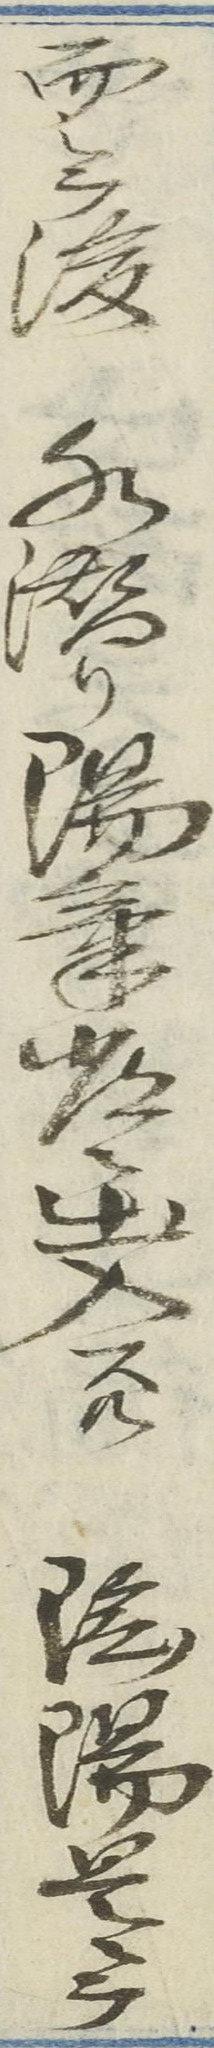而シテ後水潜リ陽気常ニ出入スル陰陽是ニテ
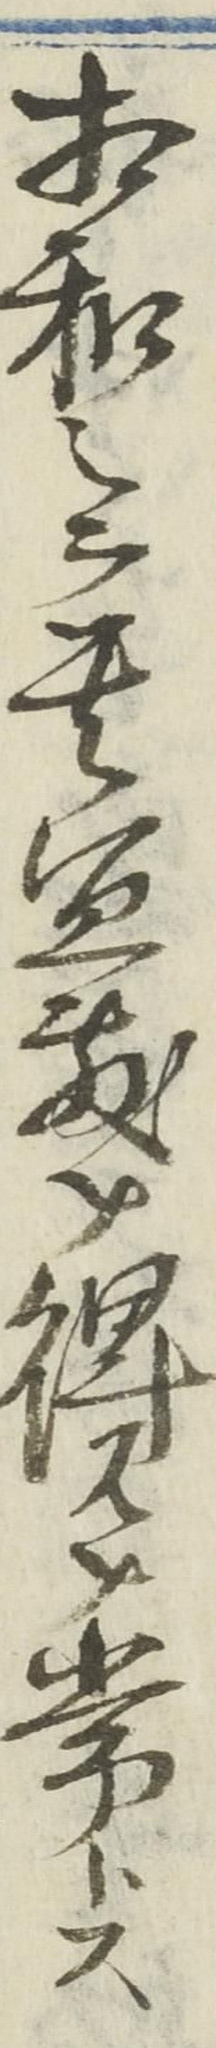相和シテ其宣敷ヲ得スヲ常トス
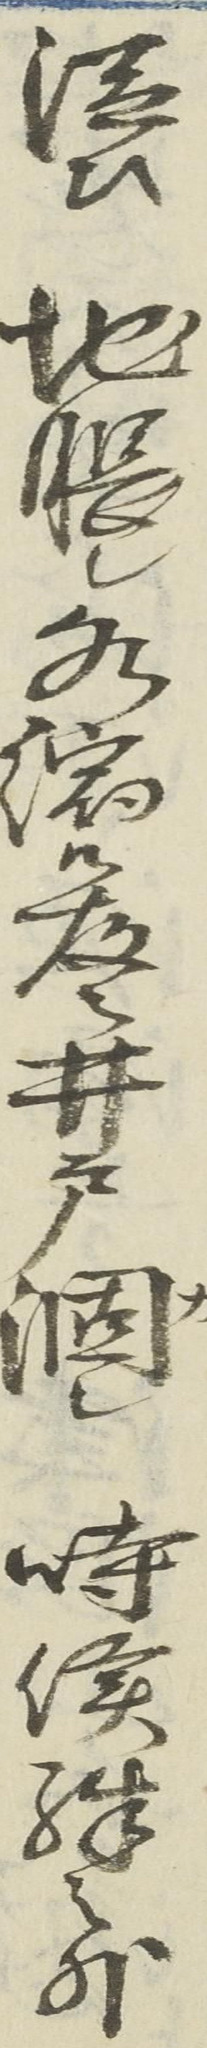従ひ地脹し水縮ル故ニ井戸涸カレ時候殊之外
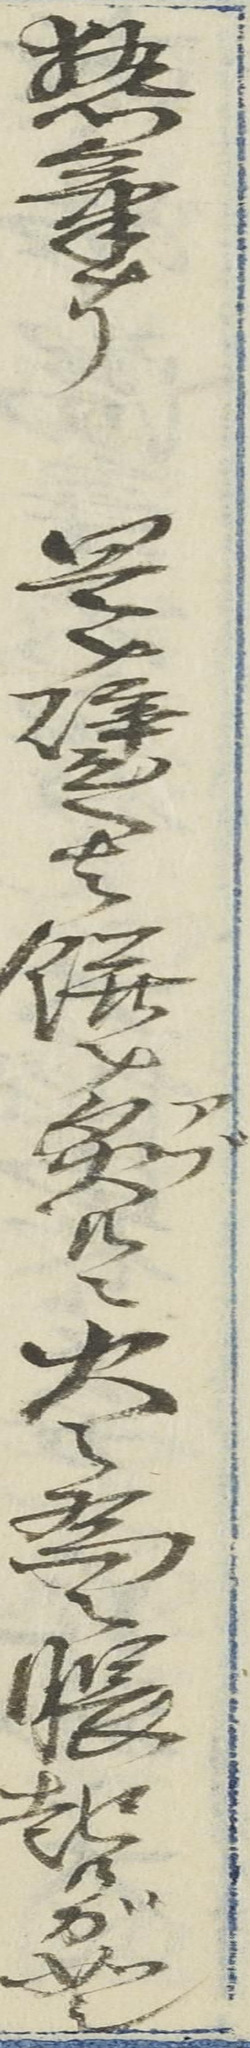熱氣ナリ是ヲ譬ヘハ餅ヲ炙アブルニ火之為ニ脹起ルガ如シ
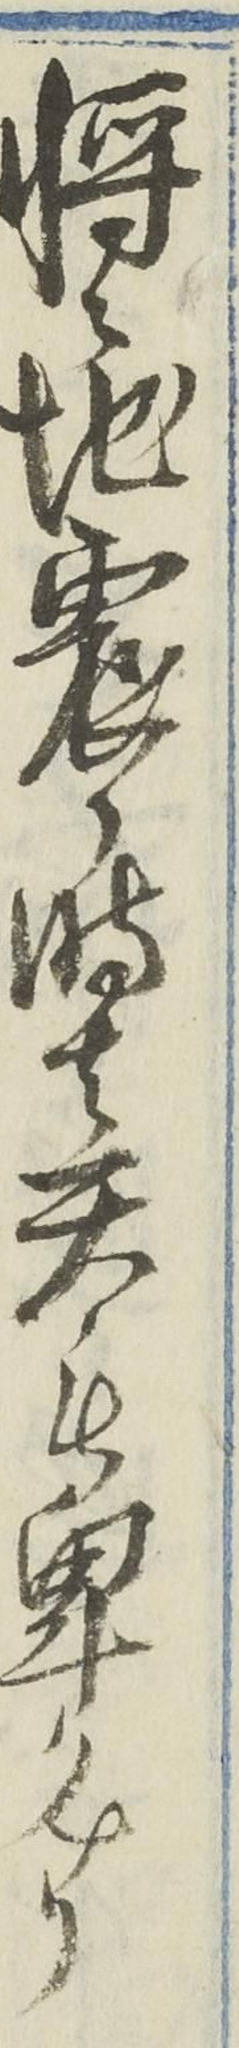将二地震ノ時は天も卑クナリ
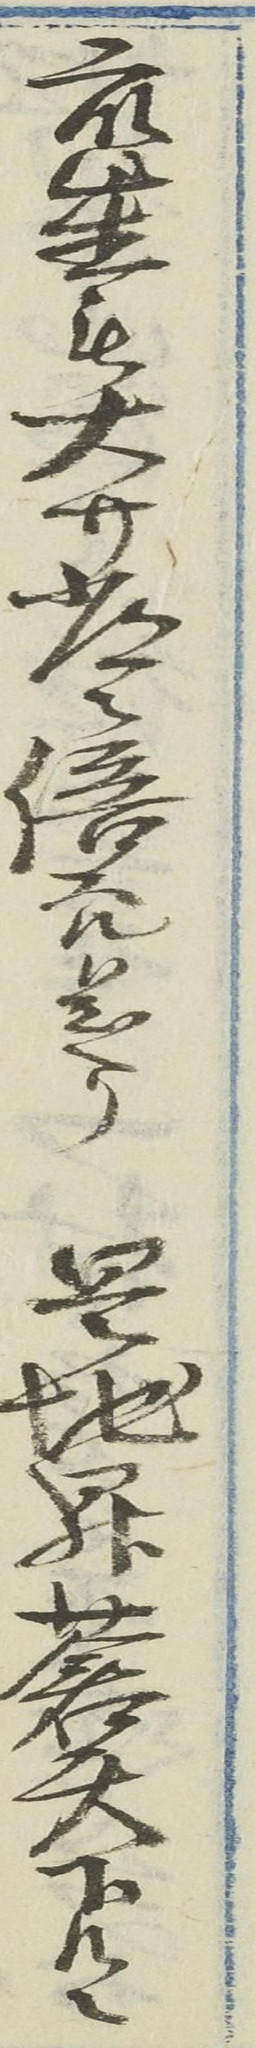衆生？モ大サ常ニ倍スルト云ヘリ是地昇蒼天下ルニ
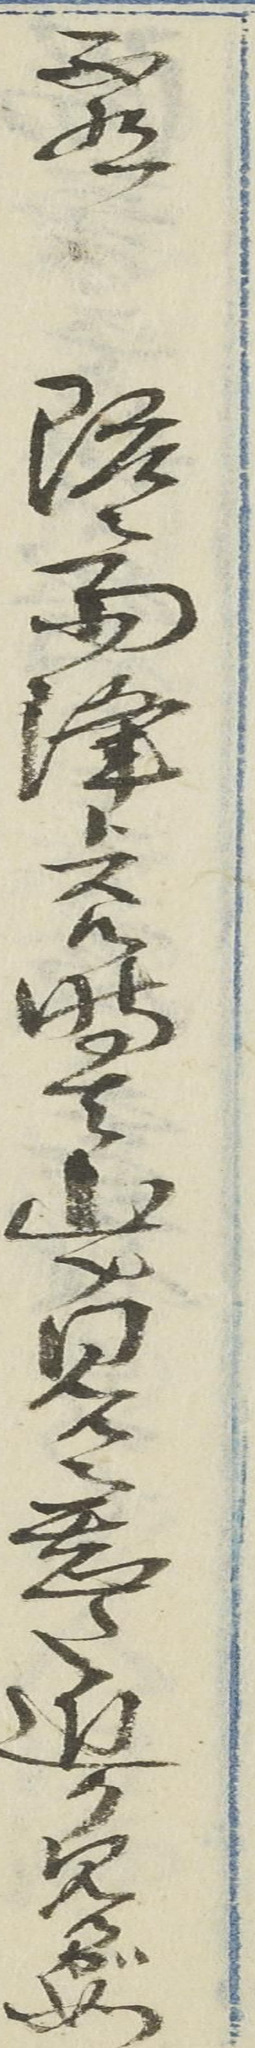不有陰ニ雨降トスル時は山ヲ見ルニ甚タ近ク見ルガ如
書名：伏水大地震
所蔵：東京大学地震研究所図書室 Earthquake Research Institute Library, The University of Tokyo, JAPAN
